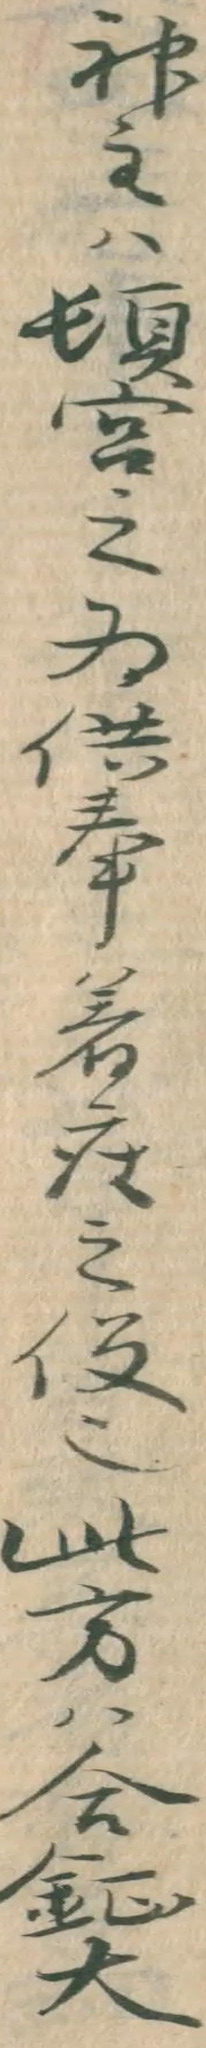神主ハ頓宮之為供奉着座之役也此方ハ合鉦大
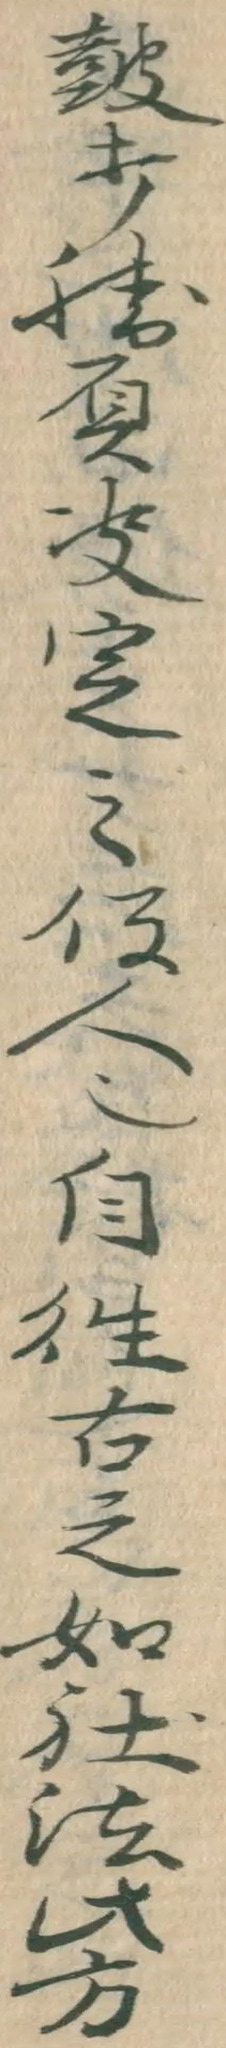鼓打勝負決定之役人也自往古之如社法此方
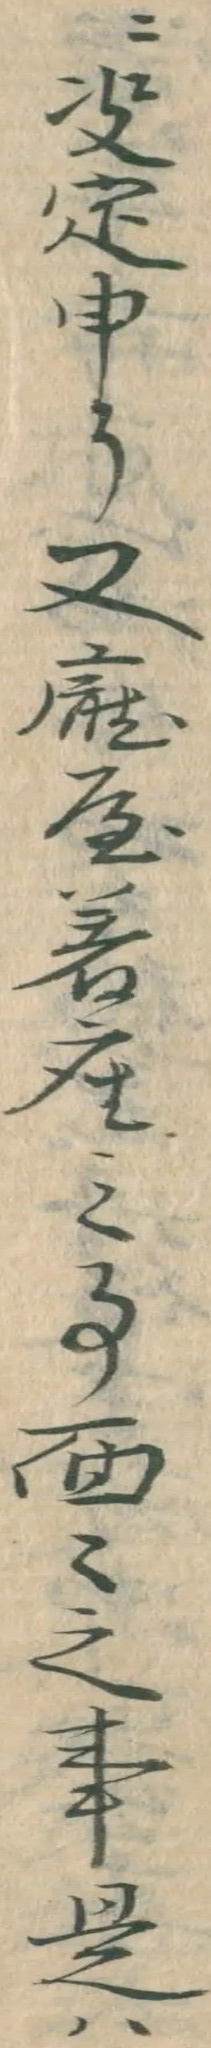ニ決定申了又庁屋着座之事面々之事是ハ
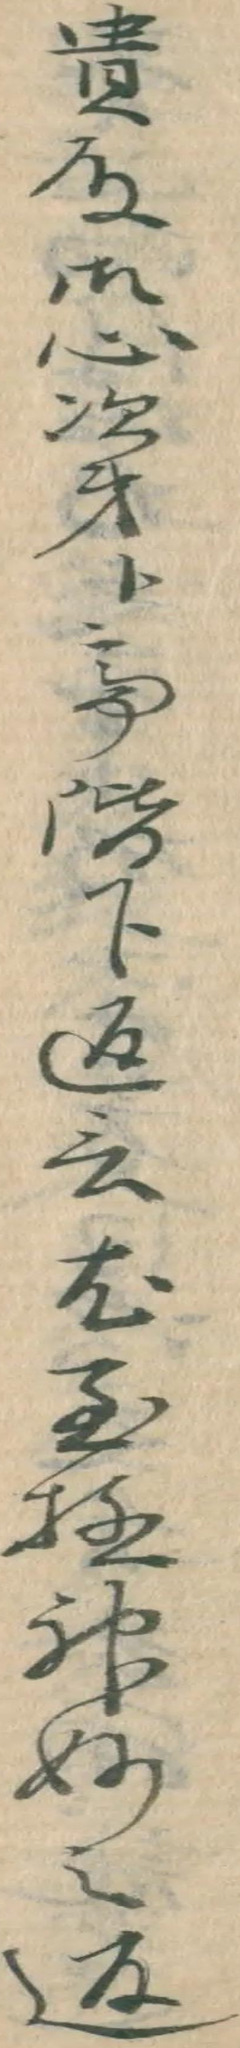貴殿御心次第トテ階下返言尤至極神妙之返

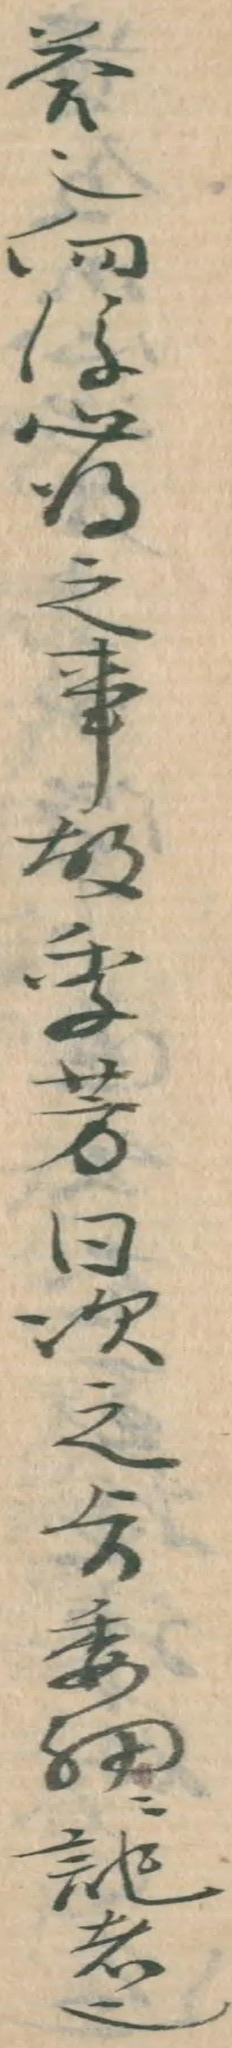答也向後心得之事故季芳曰次之旨委細ニ記者也
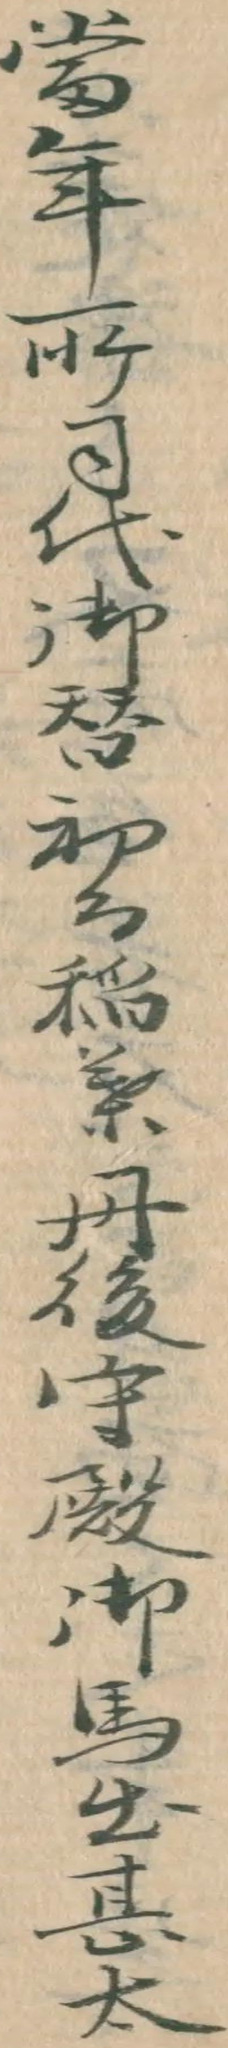当年所司代御替初而稲葉丹後守殿御馬出甚太
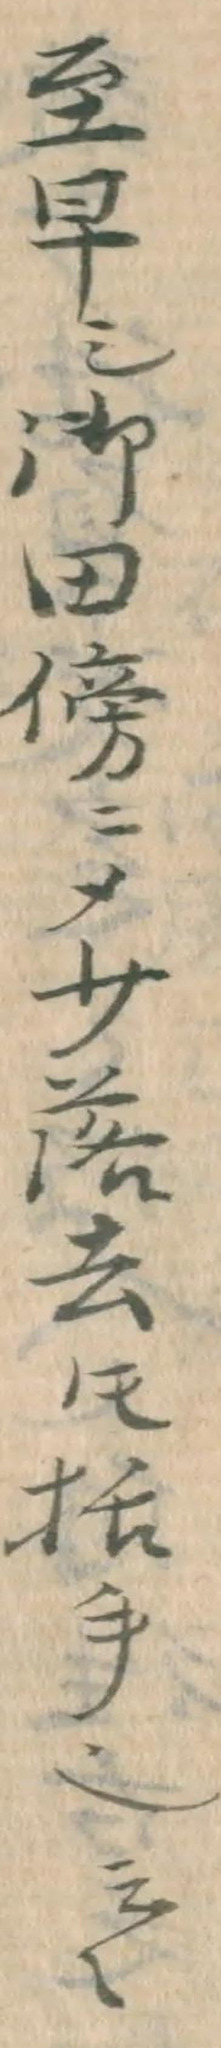至早シ御田傍ニシテ少落去トモ括手也云々
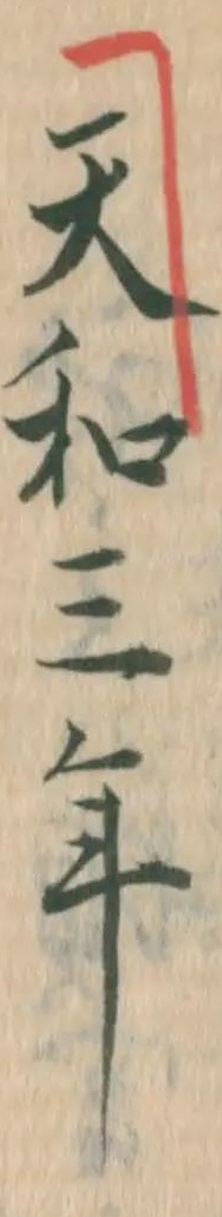天和三年
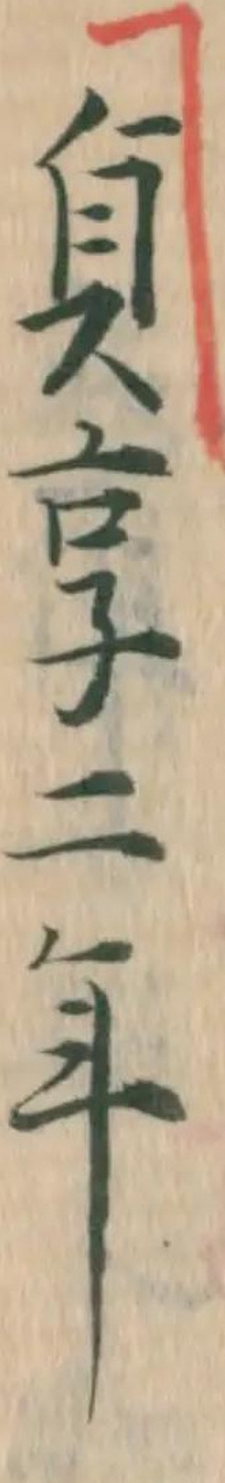貞享二年
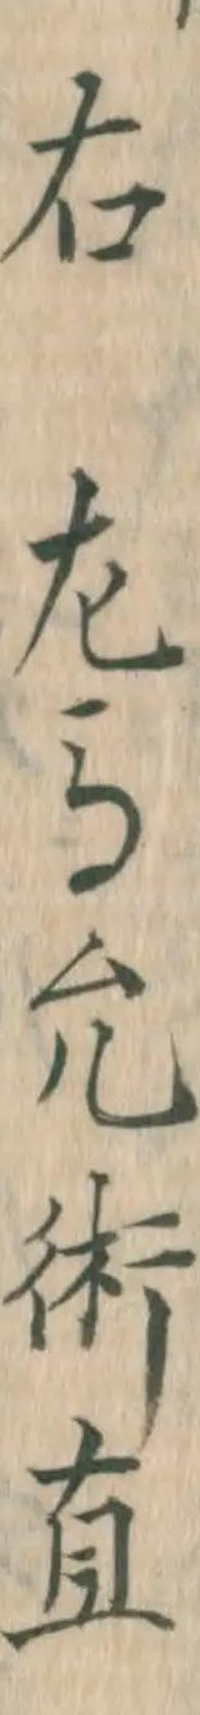右左馬允術直
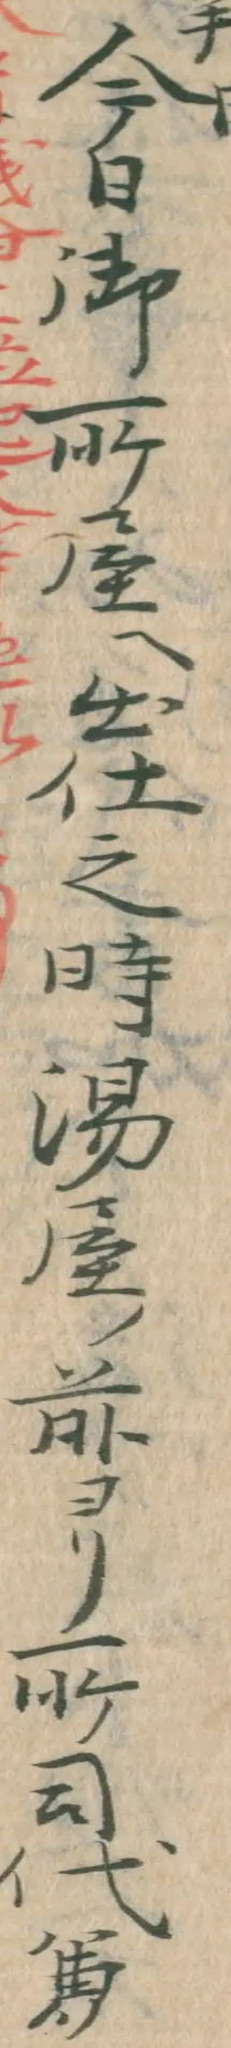今日御所屋へ出仕之時湯屋ノ前ヨリ所司代兼
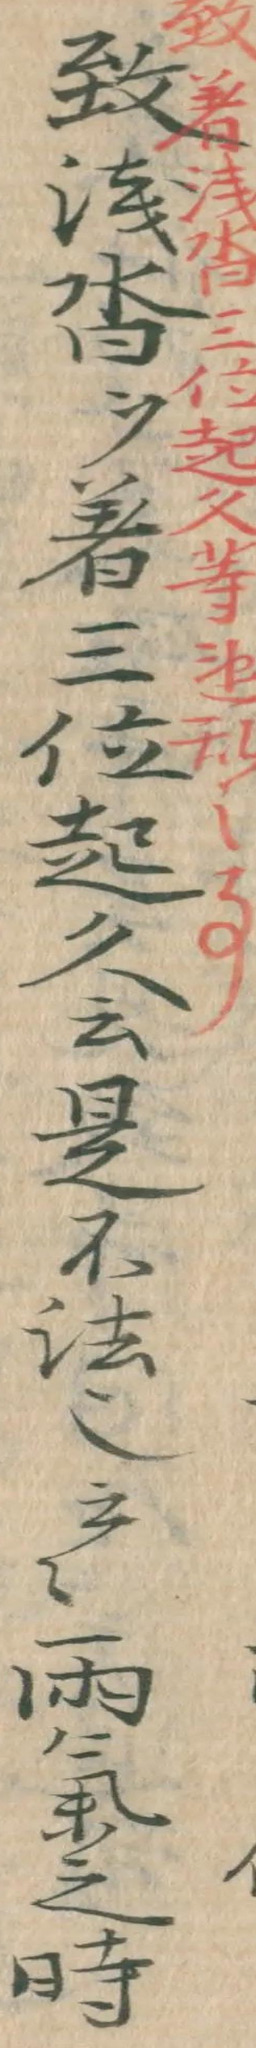致浅沓ヲ着三位起久云是不法也云々雨気之時
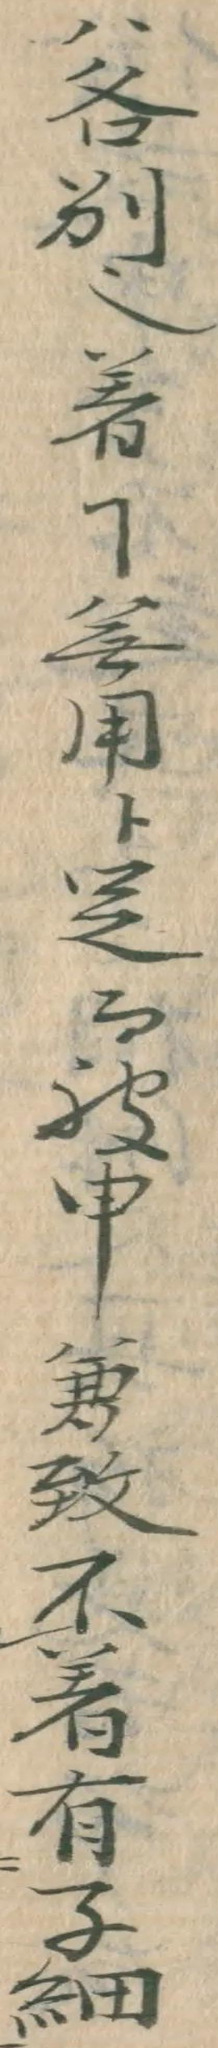ハ各別也着コト無用ト足而被申兼致不着有子細
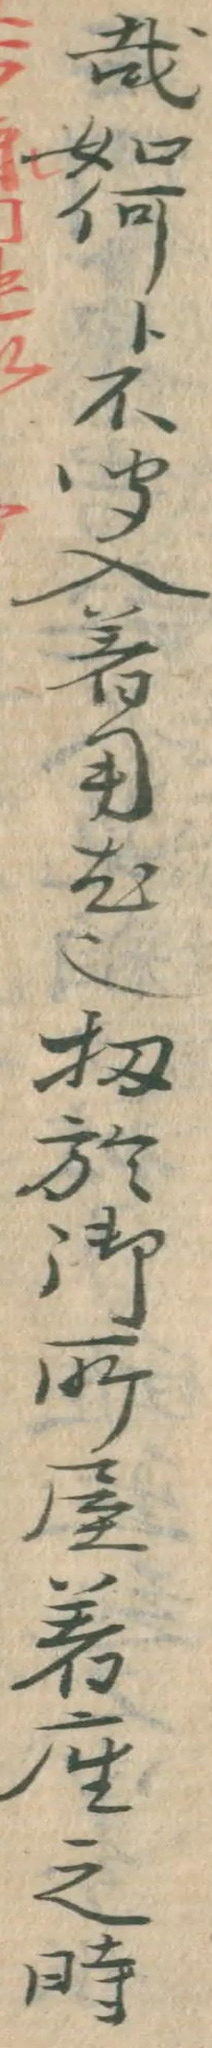哉如何ト不聞入着用尤也扨於御所屋着座之時
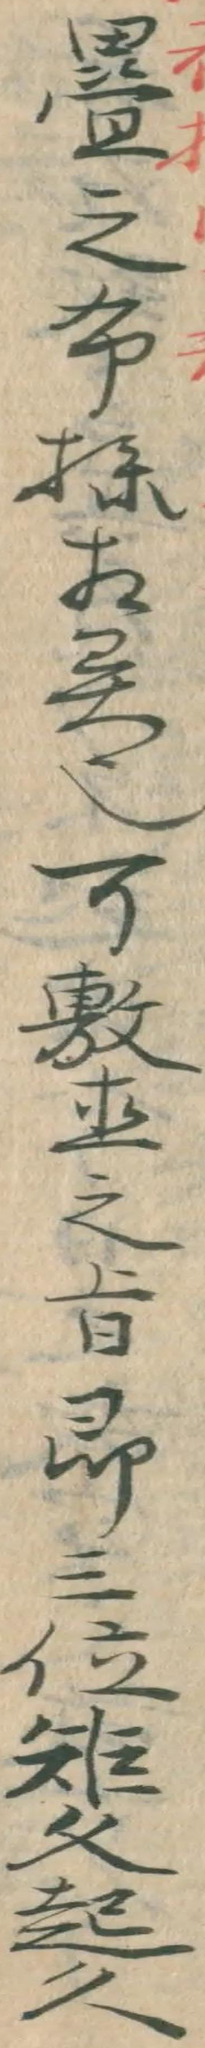畳之布様相異也可敷直之旨即三位矩久起久
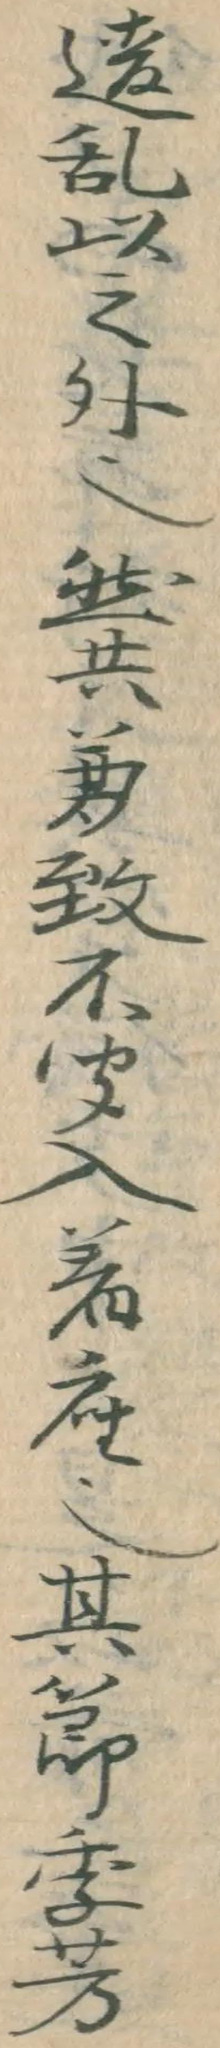違乱以之外也然共兼致不聞入着座也其節季芳
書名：賀茂社記録. 第10冊
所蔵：国立国会図書館 National Diet Library, JAPAN
